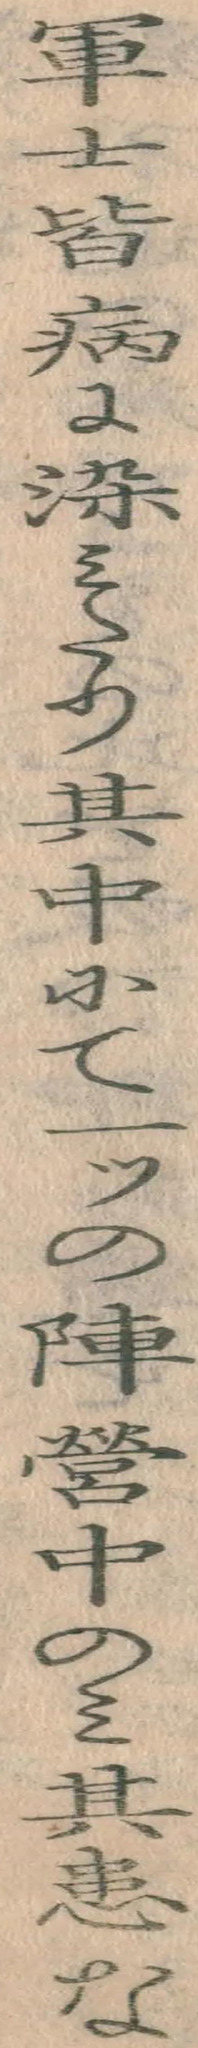軍士皆病に染みたり其中にて一ッの陣営中のみ其患な
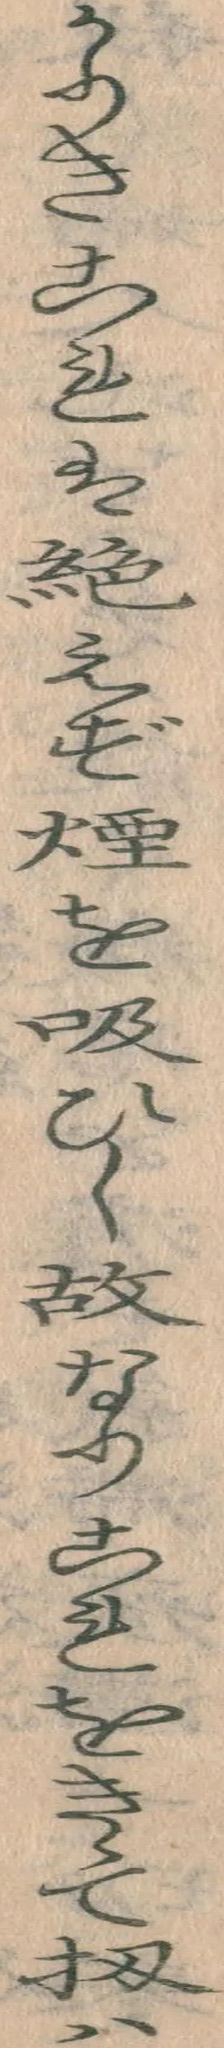かりきこれは絶えず煙を吸ひし故なりこれをきゝて扨は
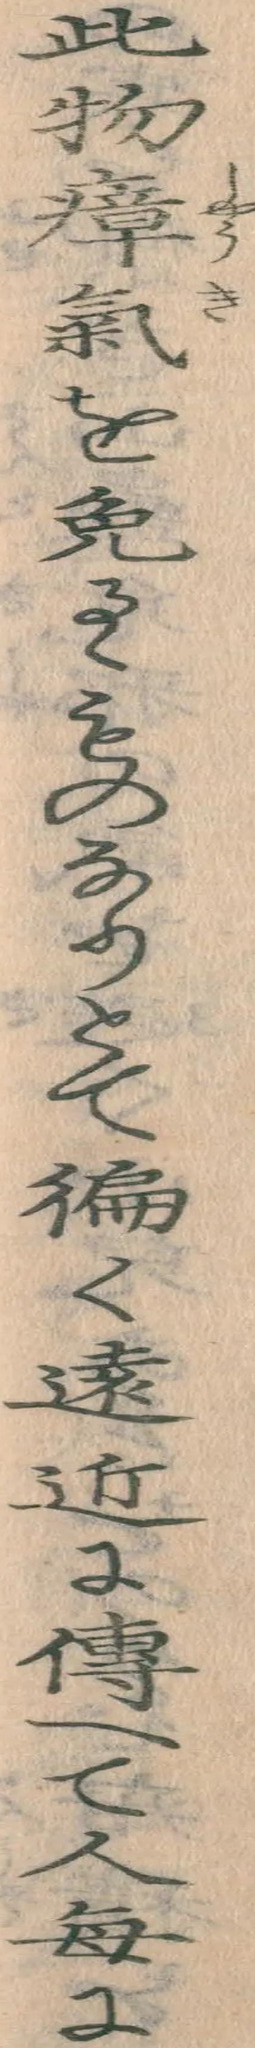此物瘴気を免るゝものなりとて徧く遠近に伝へて人毎に
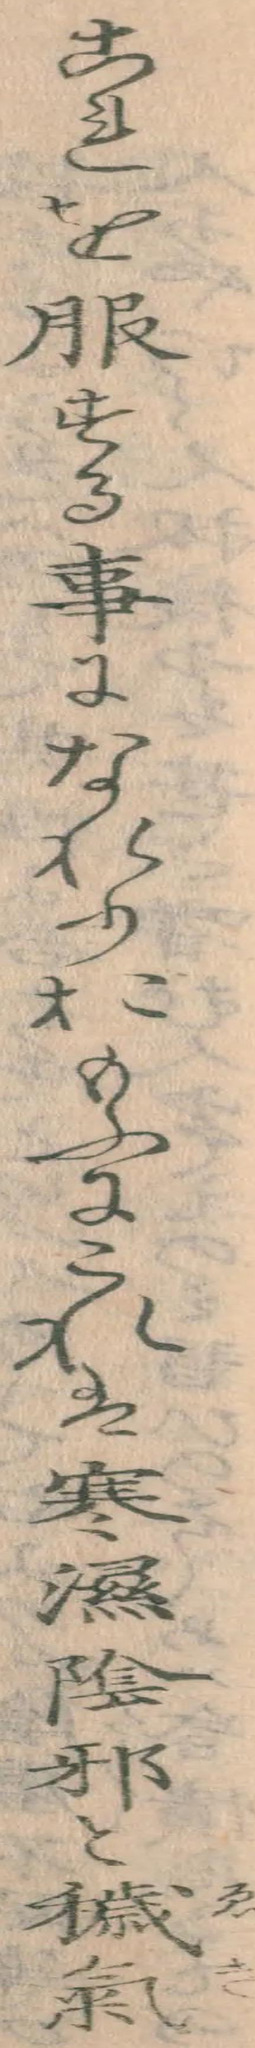これを服する事になれりおもふにこれは寒湿陰邪と穢気
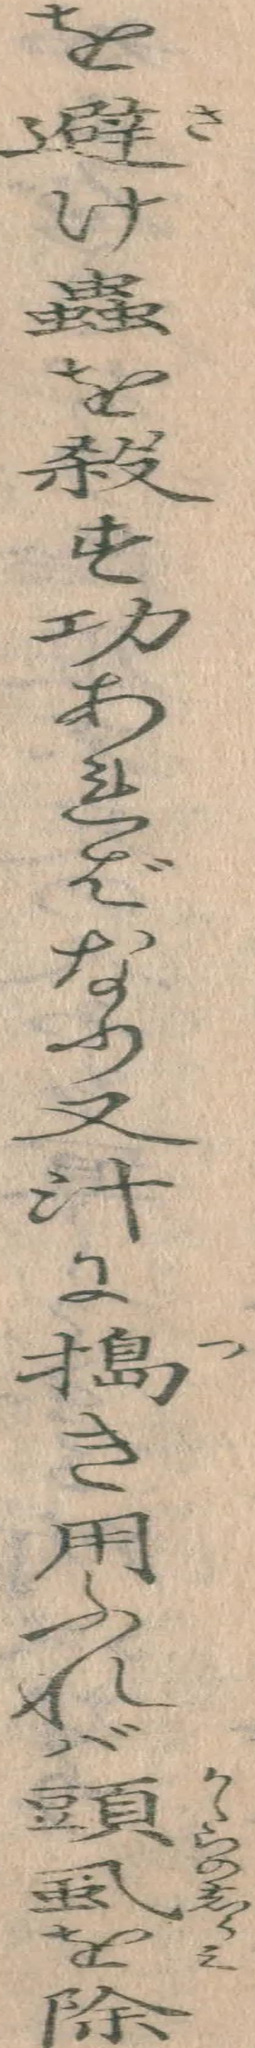を避け虫を殺す功あればなり又汁に搗き用ふれば頭虱を除
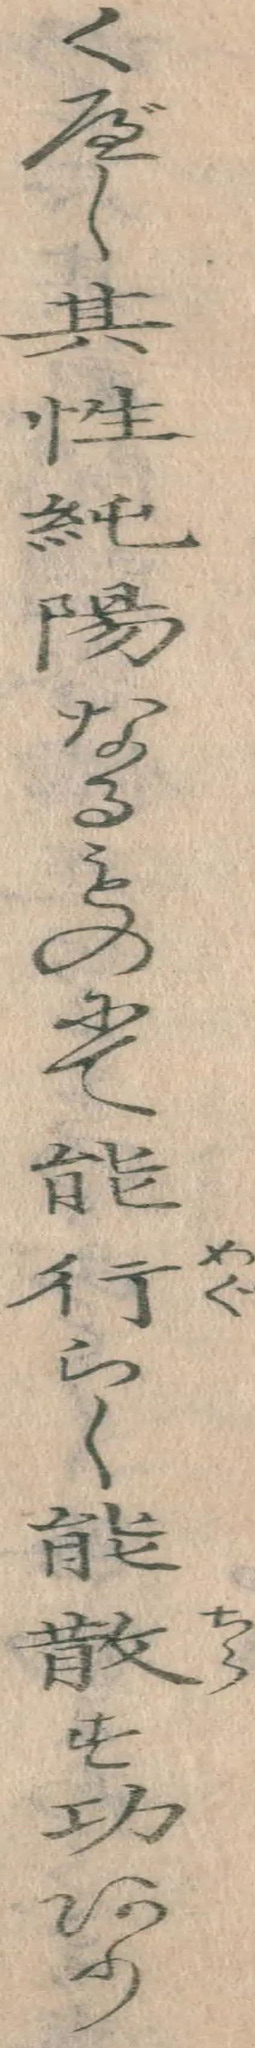くべし其性純陽なるものにて能行らし能散す功あり
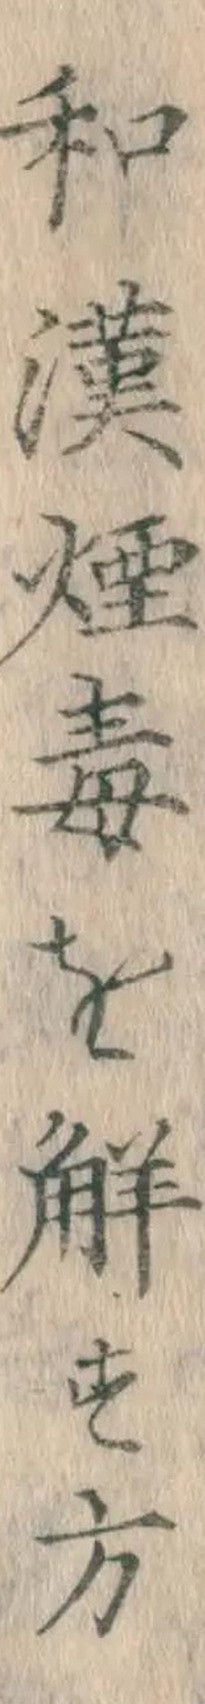和漢煙毒を解す方
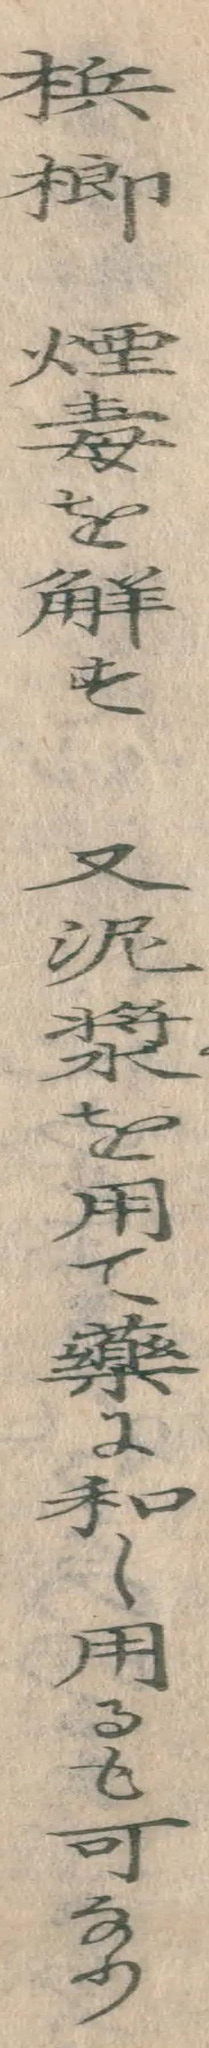梹榔煙毒を解す又泥漿を用て薬に和し用るも可なり
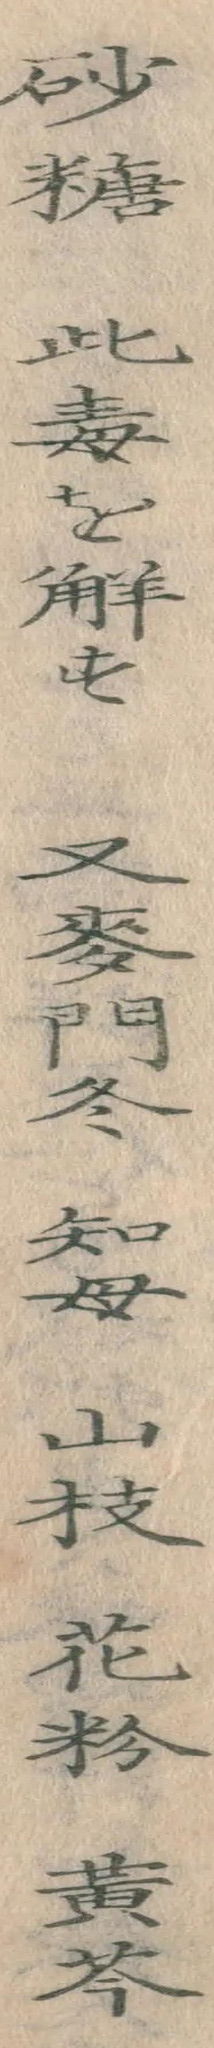砂糖此毒を解す又麦門冬知母山枝花粉黄芩
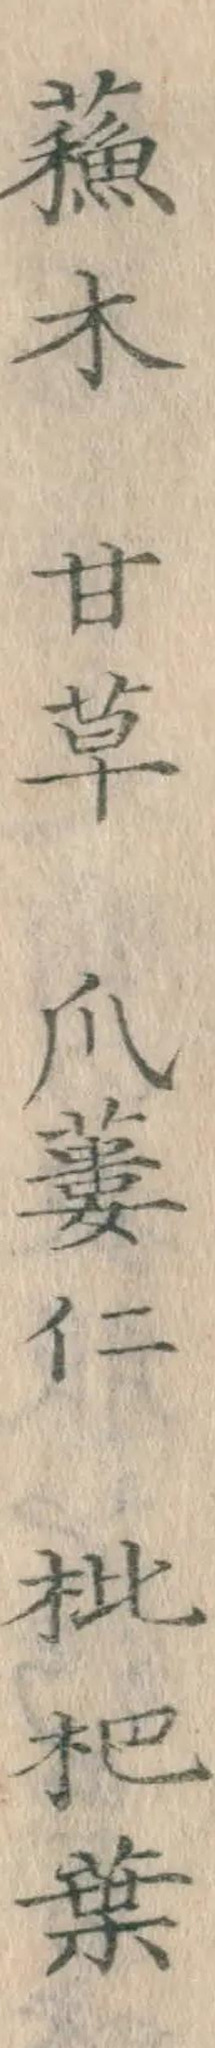蘇木甘草爪蔞仁枇杷葉
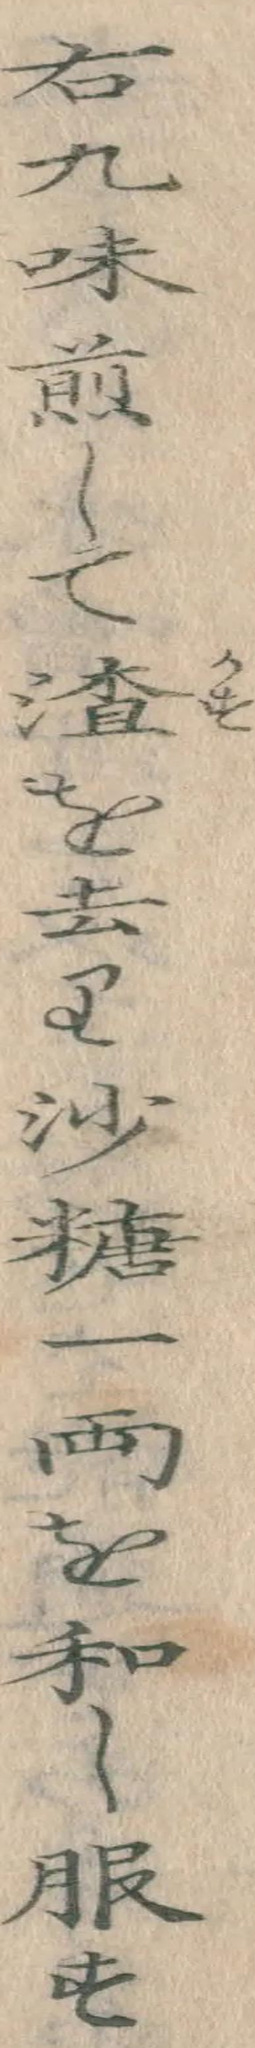右九味煎して渣を去り沙糖一両を和し服す
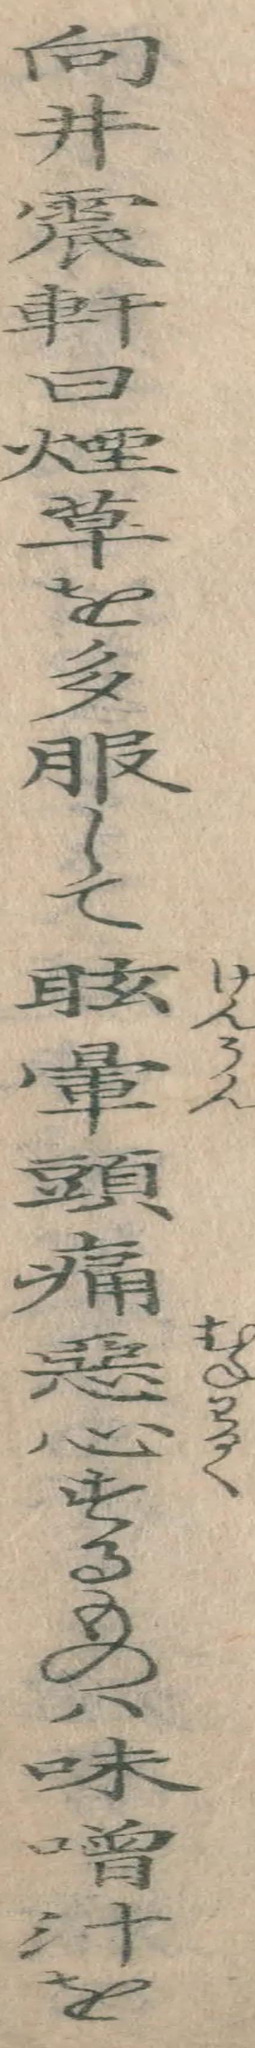向井震軒曰煙草を多服して眩暈頭痛悪心するものは味噌汁を

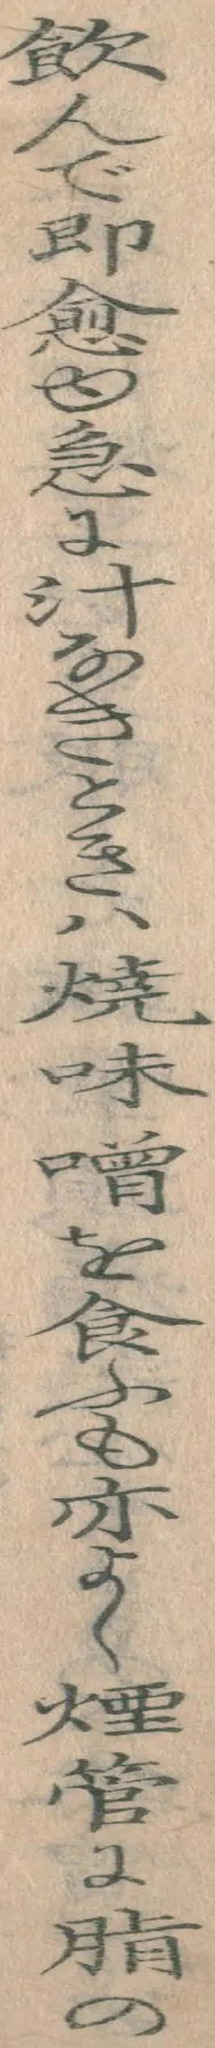飲んで即愈ゆ急に汁なきときは焼味噌を食ふも亦よし煙管に脂の
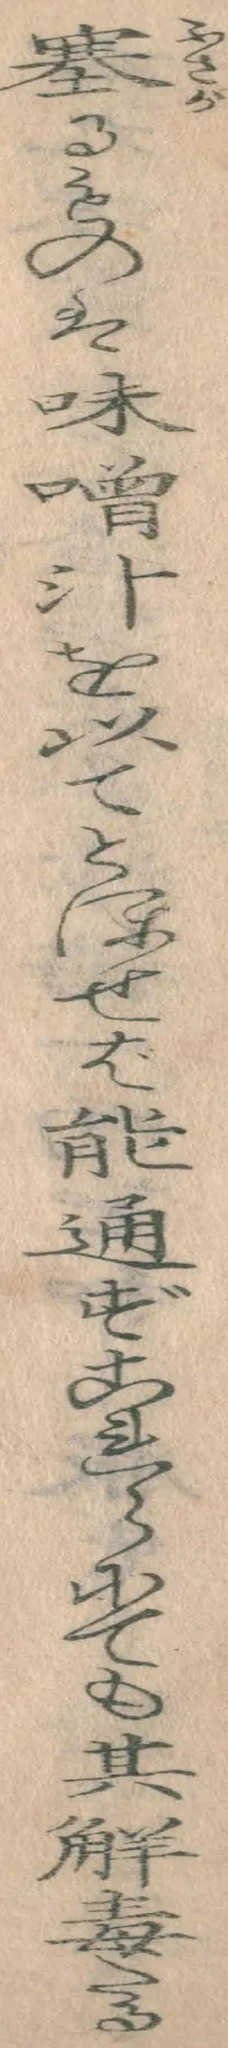塞るものは味噌汁を以てとほせば能通ずこれらにても其解毒たる
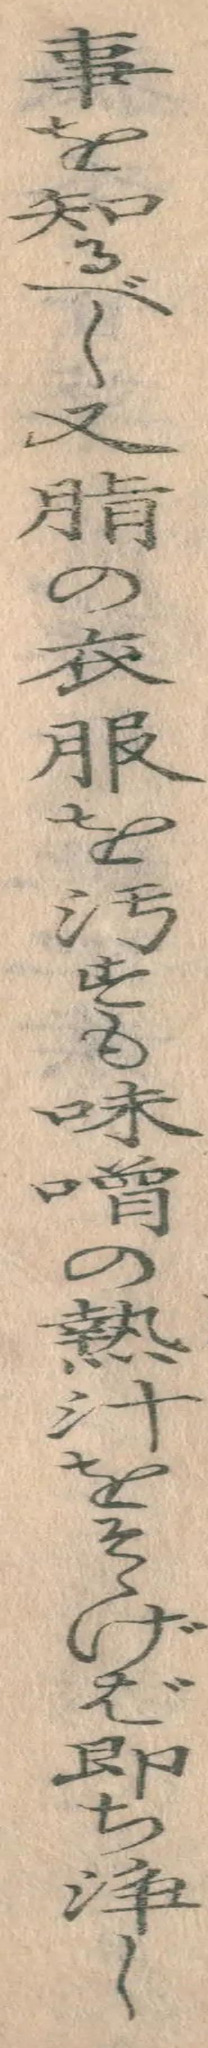事を知るべし又脂の衣服を汚すも味噌の熱汁をそゝげば即ち浄し
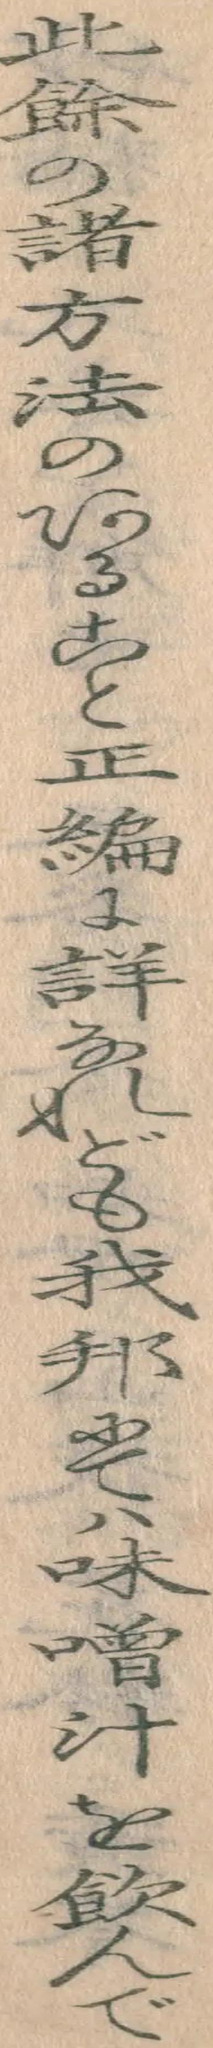此余の諸方法のあること正編に詳なれども我邦にては味噌汁を飲んで
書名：目さまし草
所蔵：国立国会図書館 National Diet Library, JAPAN
